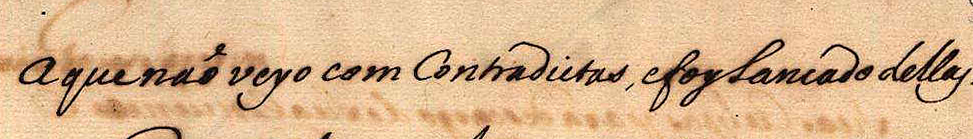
a que naõ veyo com contradictas, e foy lançado dellas.
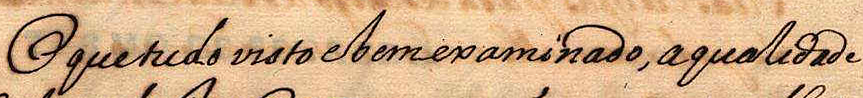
O que tudo visto e bem examinado, a qualidade
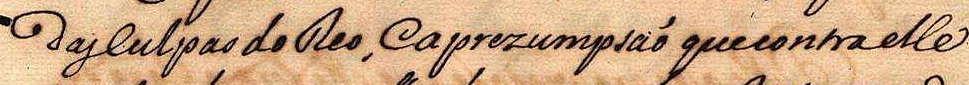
das culpas do Reo, e a prezumpsaõ que contra elle
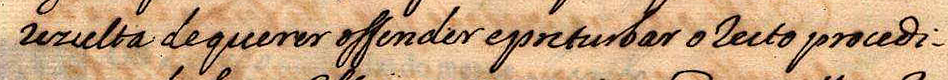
rezulta de querer offender e preturbar o Recto procedi
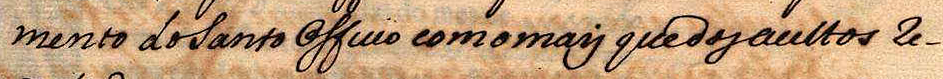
mento do Santo Officio com o mais que dos auttos Re
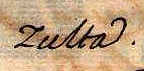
zulta.
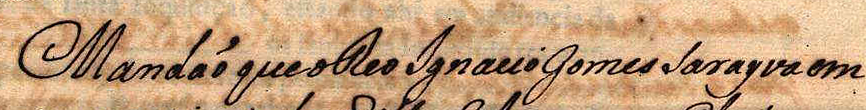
Mandaõ que o Reo Ignacio Gomes Sarayva em
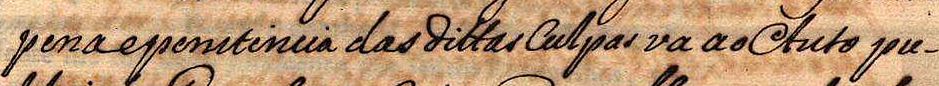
pena e penitencia das dittas Culpas va ao Auto pu
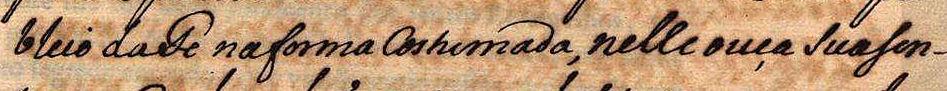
blico da Fe na forma costumada, nelle ouça sua sen
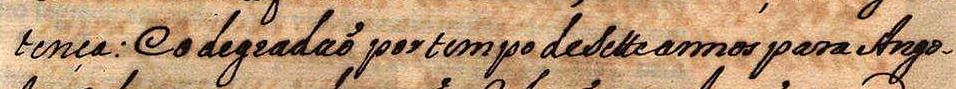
tença: e o degradaõ por tempo de sette annos para Ango
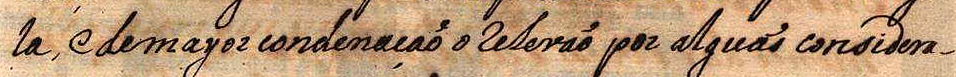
la, e de mayor condenaçaõ o Relevaõ por alguas̄ considera
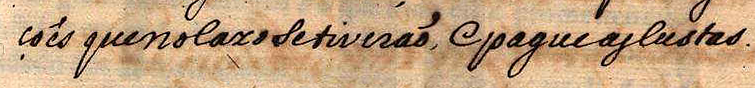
çoẽs que no cazo se tiveraõ, e pague as custas.
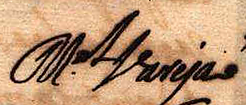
M.el Varejaõ
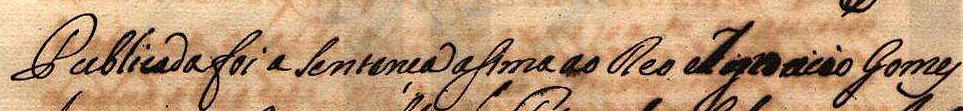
Publicada foi a sentença asima ao Reo Ignacio Gomes
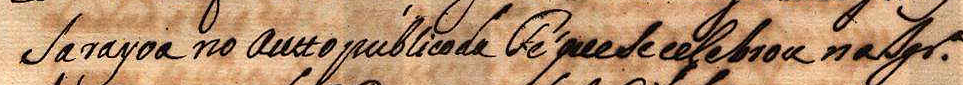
Sarayva no autto publico da Fé que se celebrou na Igr.a
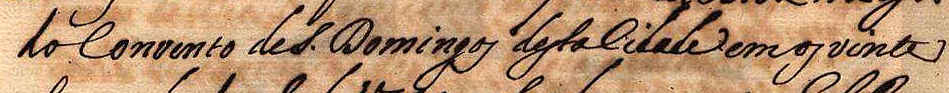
do Convento de S. Domingos desta Cidade em os vinte
